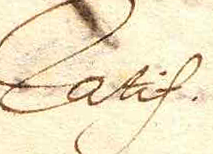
Ratif.
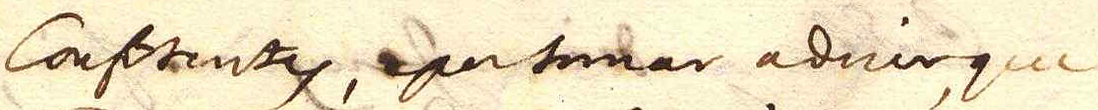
Confitentes, e por tornar a dizer, que
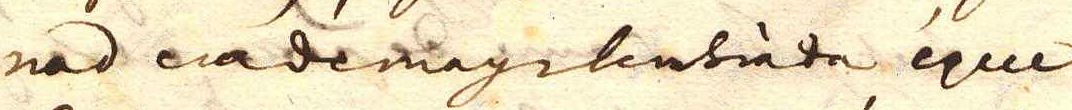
naõ era de mays lembràda, e que
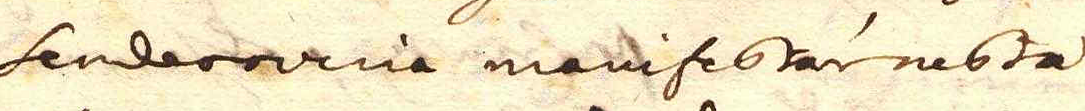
sendoo o viria manifestar nesta
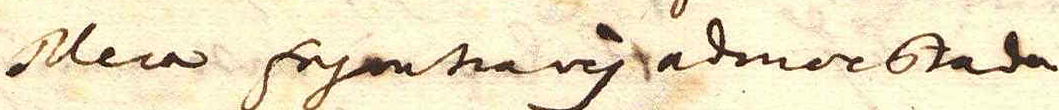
Meza foy outra vez admoestada
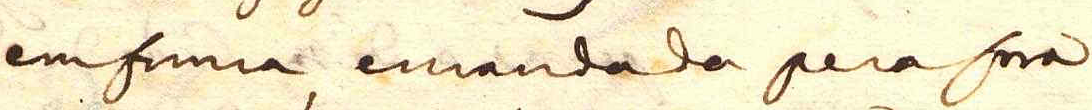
em forma, e mandada pera fora
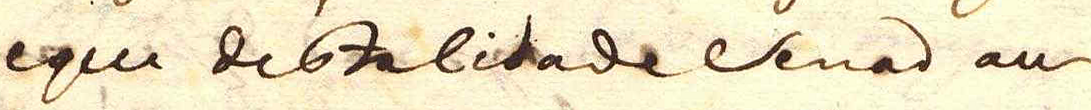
e que desta cidade se naõ au
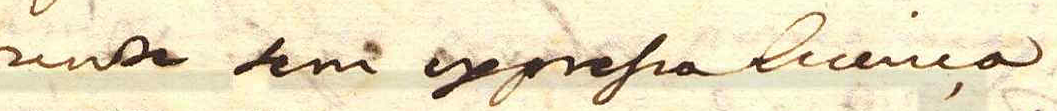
zente sem expressa licença
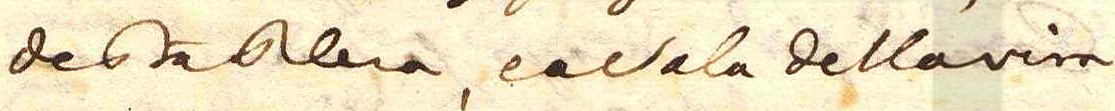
desta Mesa, e a sala della vira
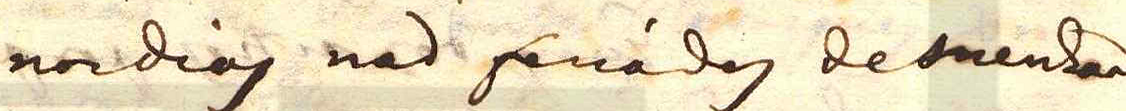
nos dias naõ feriados de menhaã
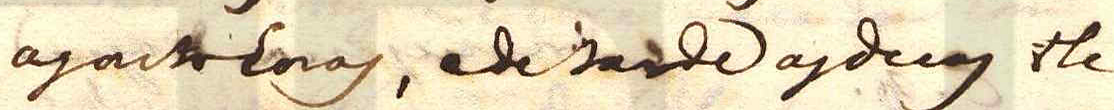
as outo horas, e de tarde as duas the
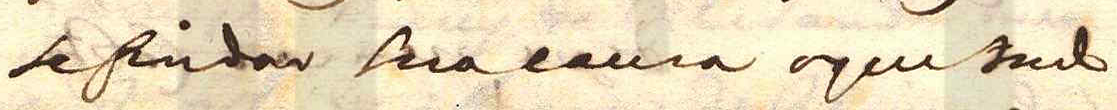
se findar sua cauza o que tudo
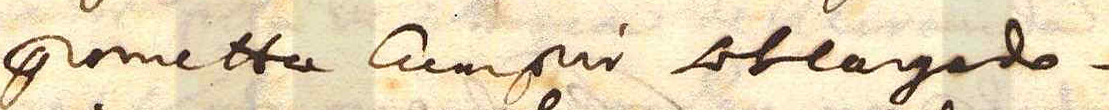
prometteo cumprir sob cargo do
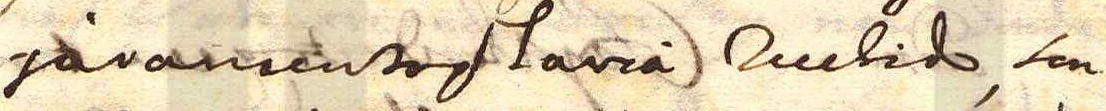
juramento q̄ havia Recebido, sen
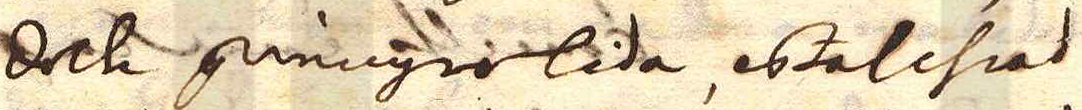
dolhe primeyro lida, esta sessaõ
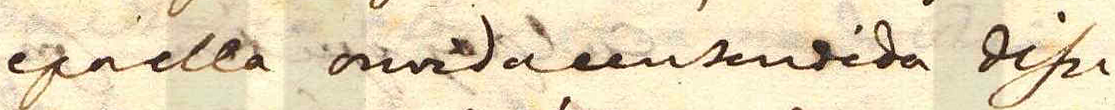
e por ella ouvida e entendida disse
